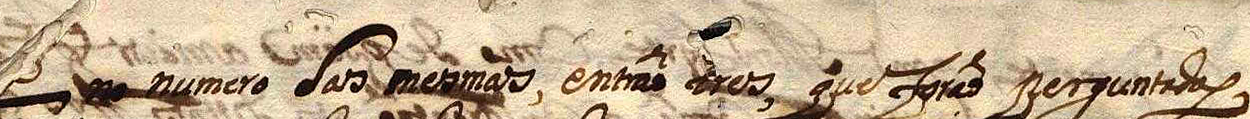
no numero das mesmas entraõ tres, que foraõ perguntadas
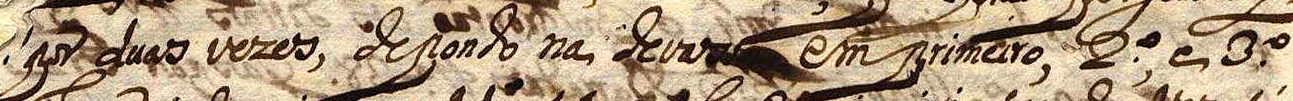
por duas vezes, depondo na devasa em primeiro, 2.o, e 3.o
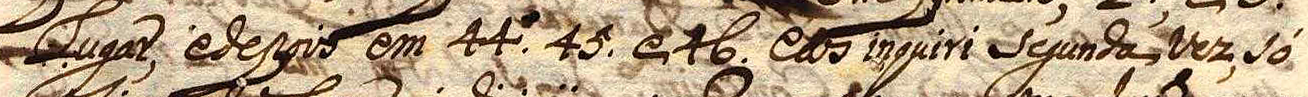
Lugar, e depois em 44o. 45. e 46. e as inquiri segunda vez, só
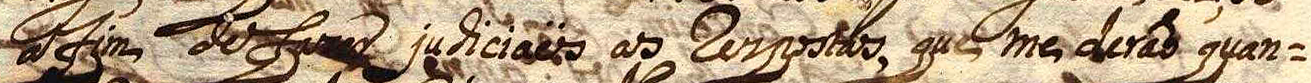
afim de fazer judiciaes as Respostas, que me derão quan
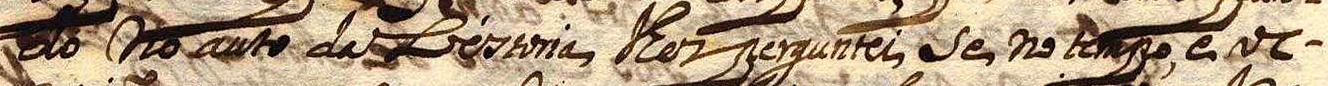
do no auto da Vestoria, lhes perguntei se no tempo, e oc
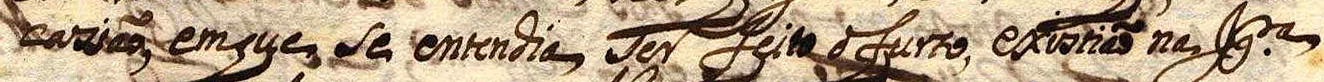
caziaõ em que se entendia ser feito o furto, existiaõ na Jg.ra
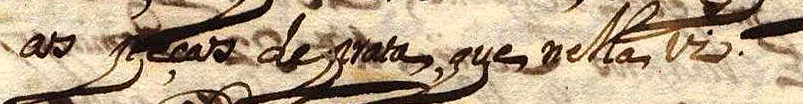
as peças de prata que nella vi.
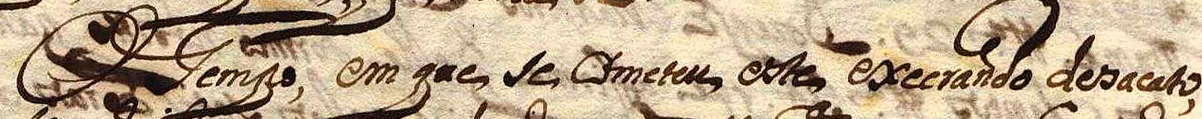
O Tempo, em que se cometeu este execrando desacato,
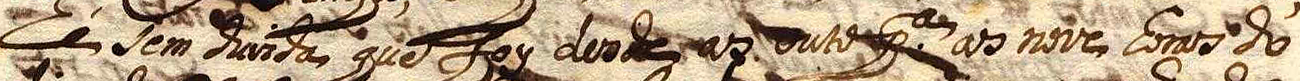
hé sem duvida que foy desde as outo p.a as nove horas do
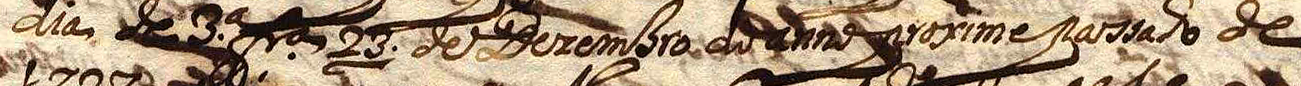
dia de 3.a fr.a 23. de Dezembro do anno proxime passado de
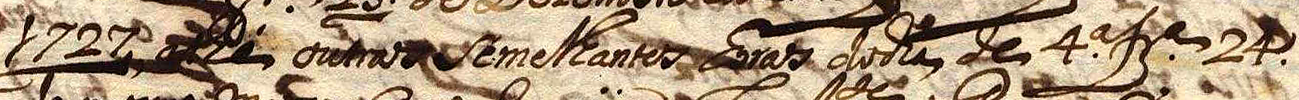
1727 athé outras semelhantes horas do dia de 4.a fr.a 24.
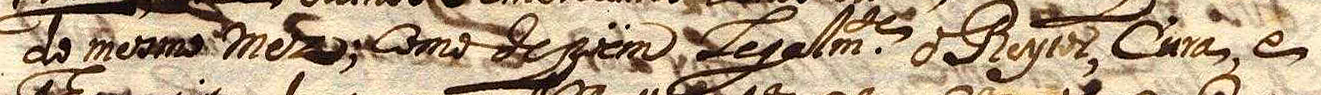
do mesmo mez; como depoem Legalm.te o Reytor, Cura, e
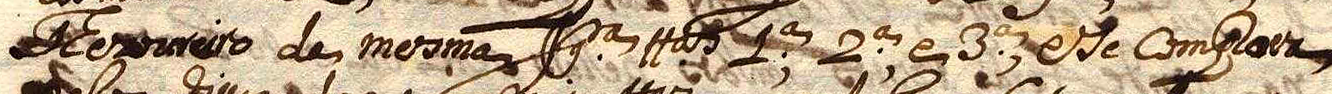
Thezoureiro da mesma Jg.ra tt.as 1.a, 2.a, e 3.a, e se compRova
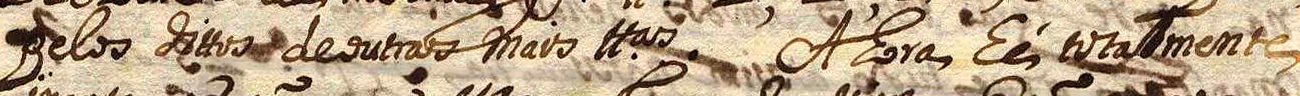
pelos dittos de outras mais tt.as. A hora hé totalmente
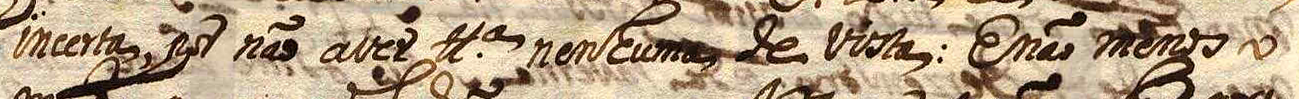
incerta, por não aver tt.a nenhuma de vista: E não menos o
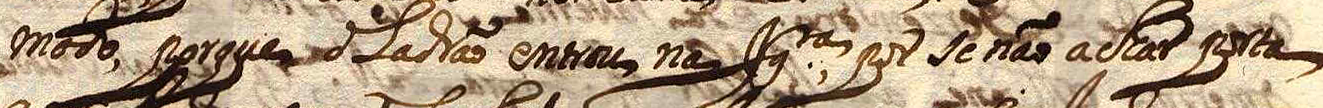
modo, porque o Ladraõ entrou na Jg.ra, por se não achar porta
